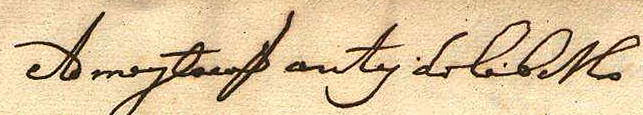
Admoestacaõ antes do libello
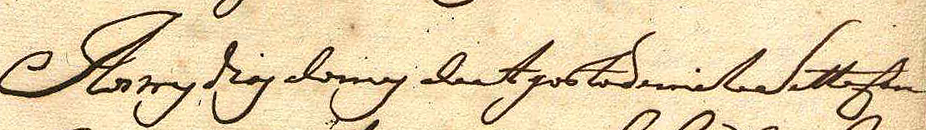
Aos tres dias do mes de Agosto de mil SeteCen
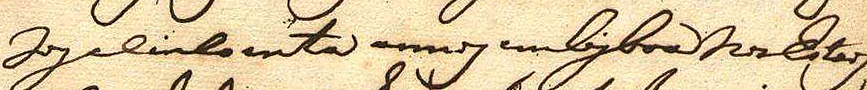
tos e cincoenta annos em Lisboa nos Estaos
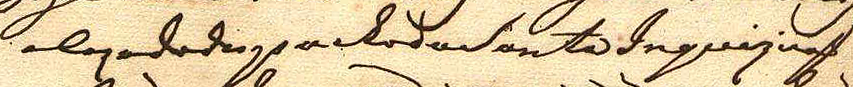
e caza do despacho da Santa Inquiziçaõ
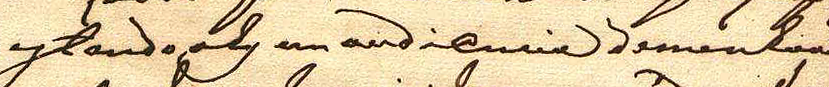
estando ahy em audiencia de menhaã
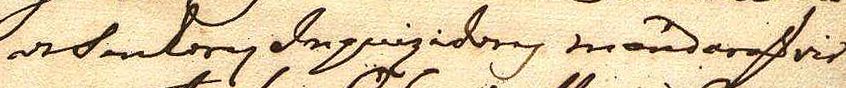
os Senhores Inquizidores mandaraõ vir
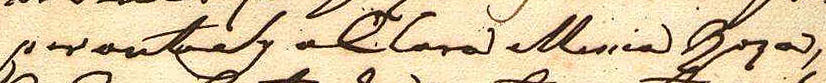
perante Sy a Clara Mersia Roza,
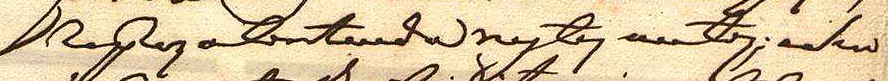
Re preza Conteuda nestes autos; e Sen
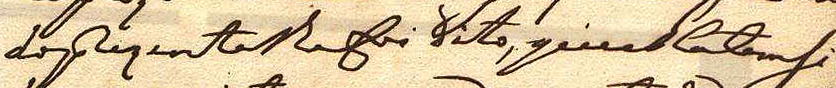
do prezente lhe foi dito, que ella tem si
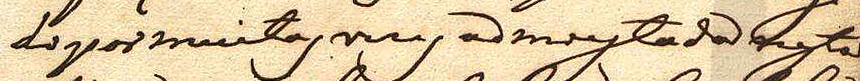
do por muitas vezes admoestada nesta
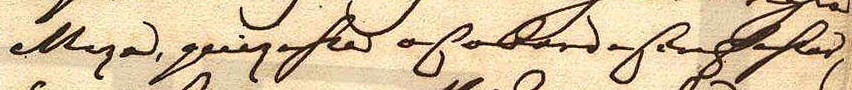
Meza, quizesse aCabar de Confessar
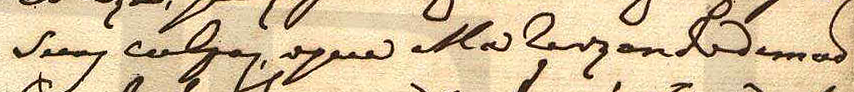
Suas culpas, o que ella Revzando de maó
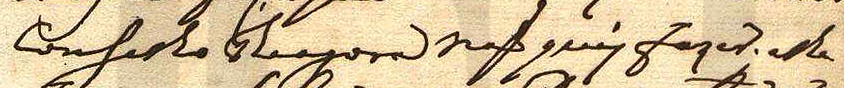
Conselho the agora naõ quis fazer. e lhe
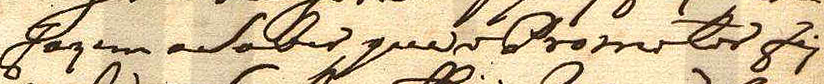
fazem a Saber que o Promotor fis
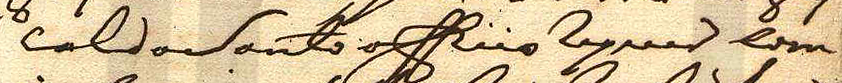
cal do Santo officio Requer com
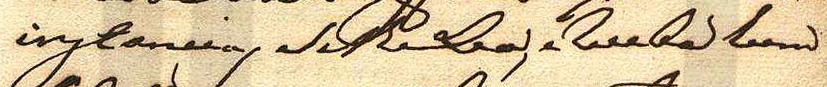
instancias se lhe Lea, e Receba hum
